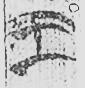王
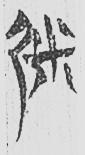屎
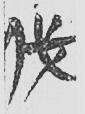伐
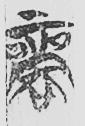商
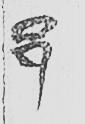邑
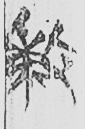殺
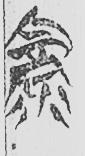{宀彔}
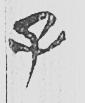子
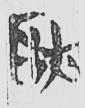耿
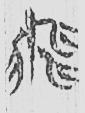飛
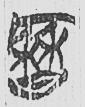{厤甘}
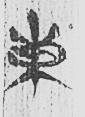東
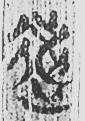逃
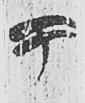于
